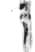𫵖
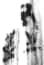○（建）
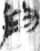於
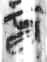晨
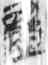○（陷）
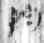於
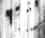巳
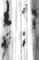○（破）
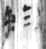於
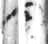午
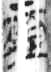坪（平）
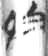於
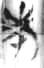未
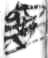寍（寧）
